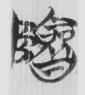險
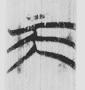天
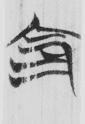命
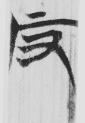反
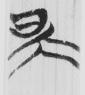{日夨}
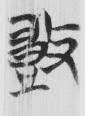{豈攴}
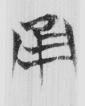甬
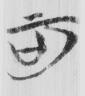可
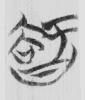智
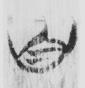自
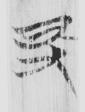𠭁
